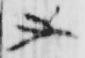之
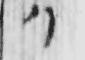人
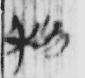利（利）
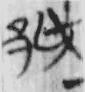○（越）
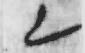乙
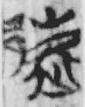鄜
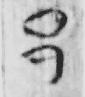邑
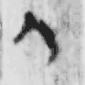人
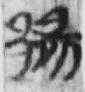昜（陽）
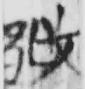○（越）
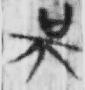吳
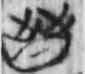晉
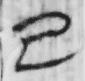己
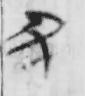丑
